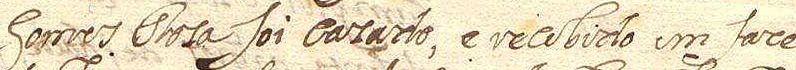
Gomes Roza foi cazado, e recebido em face
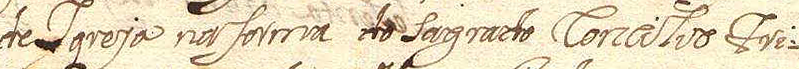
de Igreja na forma do Sagrado Concilio Tri
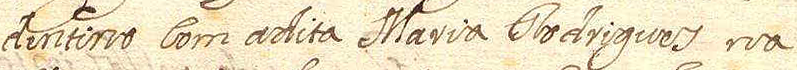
dentino com a dita Maria Rodrigues na
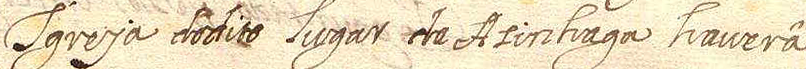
Igreja do dito lugar da Azinhaga hauerā
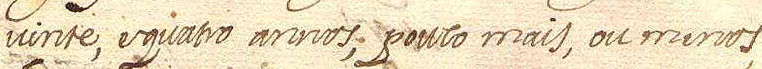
uinte, e quatro annos, pouco mais, ou menos,
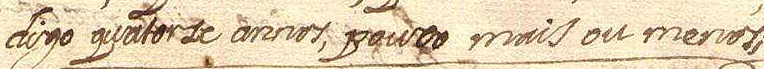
digo quatorze annos, pouco mais ou menos;
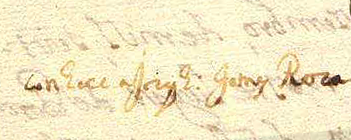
conhece a Jozeph: Gomes Roza
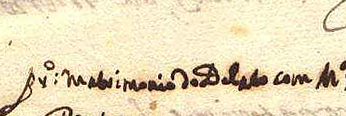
pro: matrimonio do Delato com Ma:
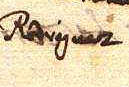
Rodriguez
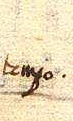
tempo.
